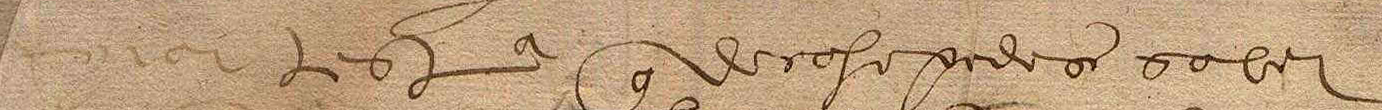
yrar testa q̄ do caso podesē saber
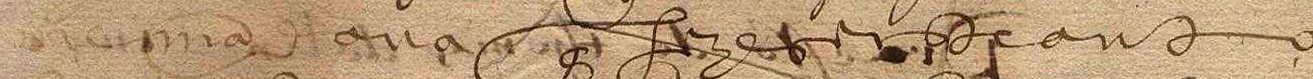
me mādaua q̄ fezese este auto
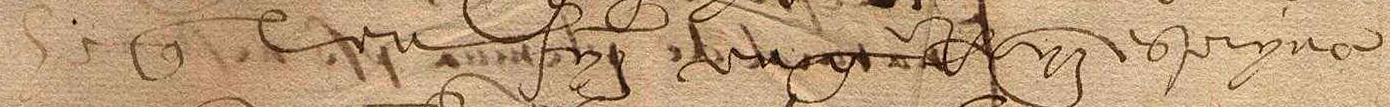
ho q̄l eu fyz eu go Roiz̄ espryuā
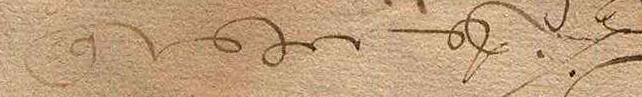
q̄ esto esp̄uj.
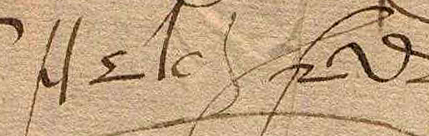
Melch frez
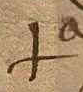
ta
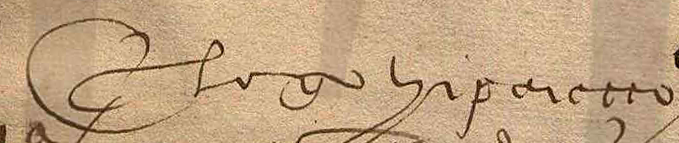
E logo hi pareceo
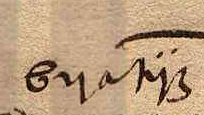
brjatijz
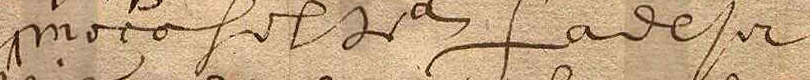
moça soltra fa de Jor
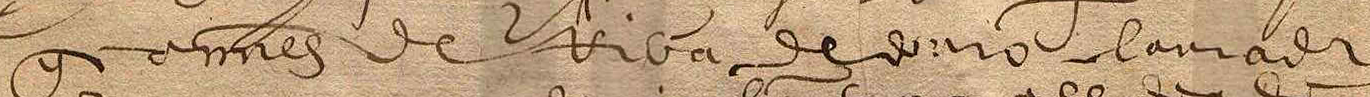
ge an̄nes de Riba de douro laurador
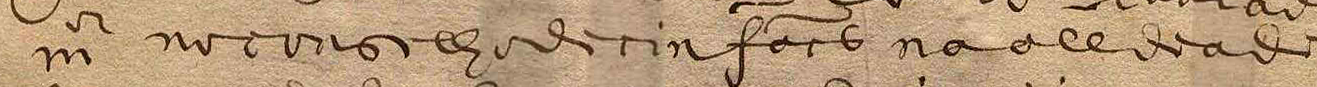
mor no conselho de cinfães na alldea de
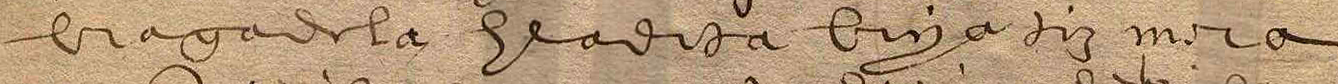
bragadela he a dita bryatiz mora
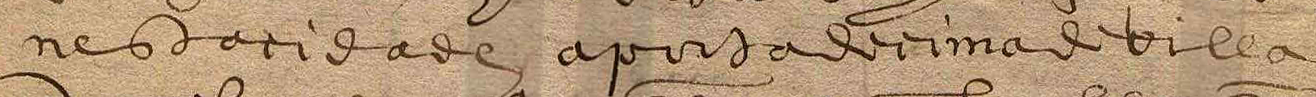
nesta cidade a porta de cima de villa
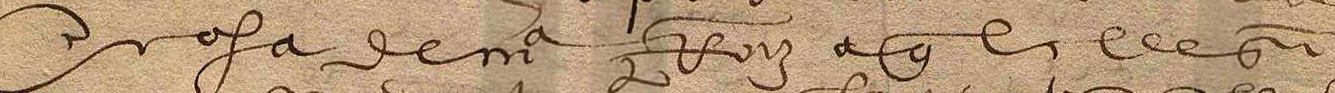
ē casa de ma R̄oiz a q̄l elle s̄or
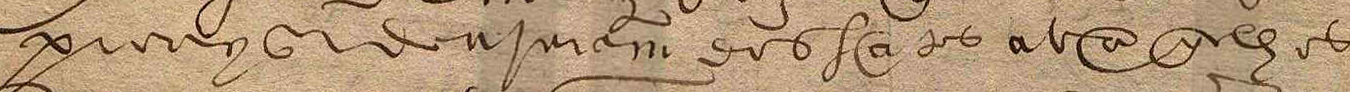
prouysor deu juramto dos sātos avāgelhos
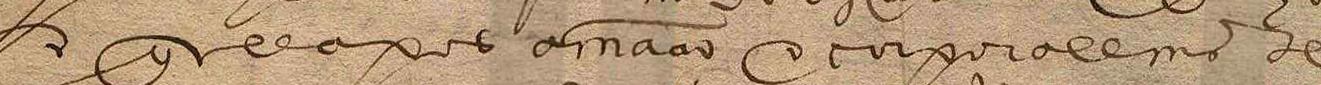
ē q̄ ella pos a mãao e corporallmēte
